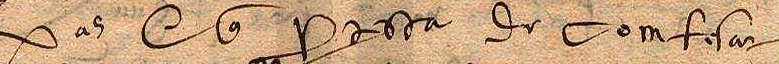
pas e q̅ ꝓtesta de Comfesar
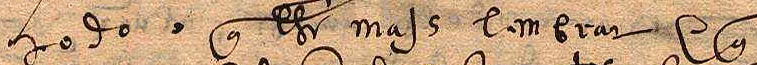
todo o q̅ lhe maJs lembrar e q̅
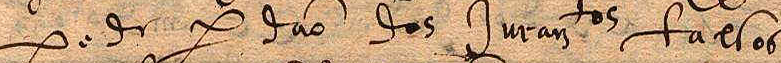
pede ꝑdão dos Juramtos falsos
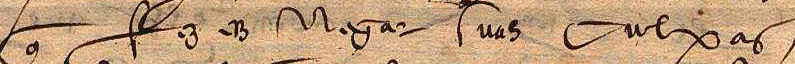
q̅ fez em Negar suas Culpas /
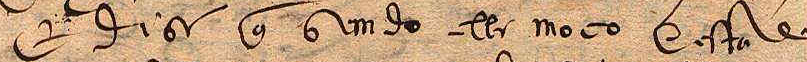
E dise q̅ semdo elle moço e esta̅do
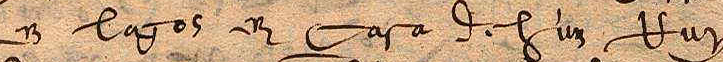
em lagos em Casa de hum Ruy
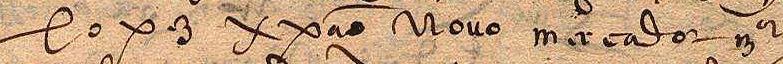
lopez Xpão Nouo mercador mor
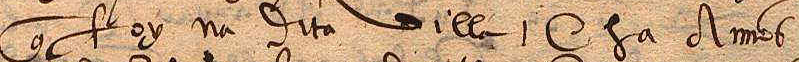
q̅ foy na dita villa / e ha Annōs
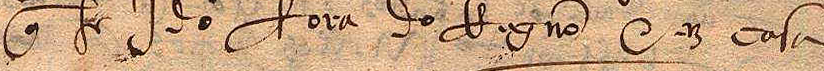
q̅ he Jdo fora do Regnō e em casa
